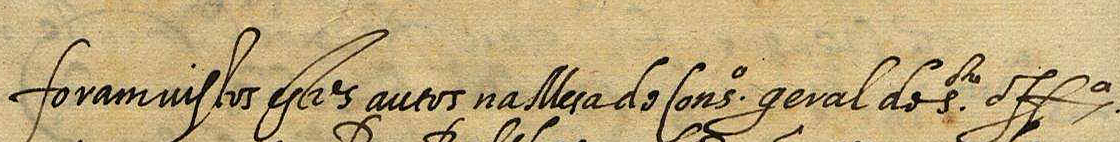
foram uistos estes autos na Mesa do Cons.o geral do s.cto offo.
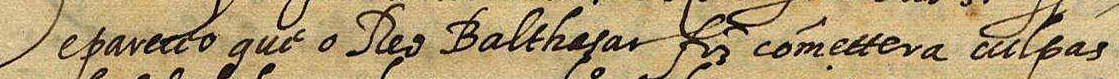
e pareceo que o Reo Balthasar frz̄ com̄ettera culpas
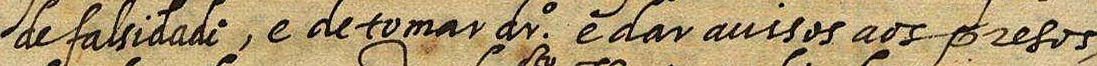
de falsidade, e de tomar dro. e dar auisos aos presos,
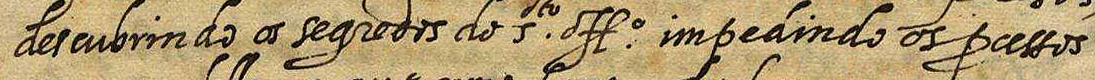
descubrindo os segredos do scto. offo. impedindo os ꝓcessos
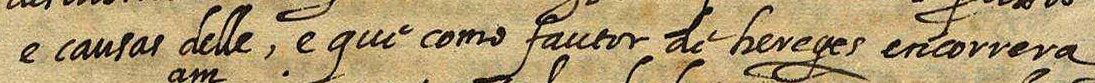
e causas delle, e que como fautor de hereges encorrera
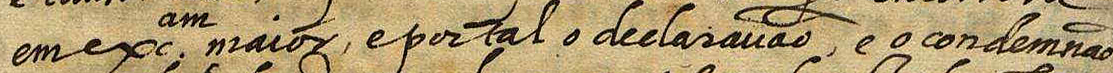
em exc.am maior, e por tal o declarauão, e o condemnão
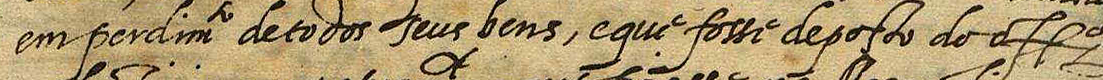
em perdimto de todos seus bens, e que fosse deposto do offo
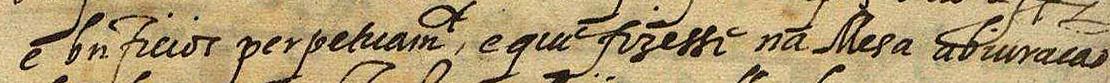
e bn̄ficios perpetuamte, e que fizesse na Mesa abiuração
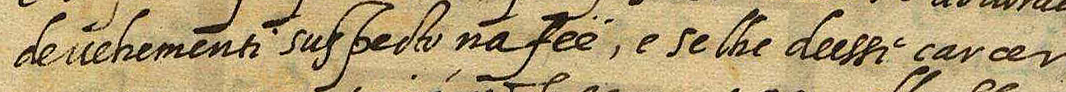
de uehementi suspecto na fee, e se lhe deesse carcer
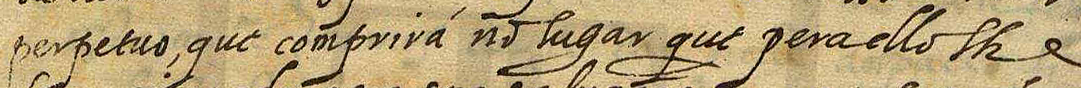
perpetuo, que comprirá no lugar que pera elle lhe
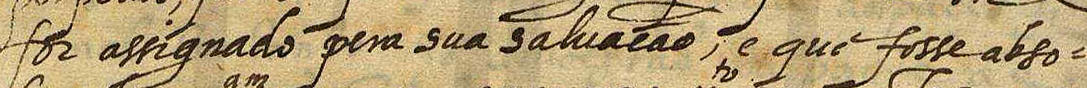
for assignado pera sua saluação, e que fosse abso
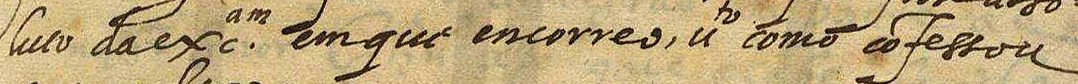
luto da exc.am em que encorreo, uto como cōfessou
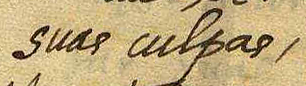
suas culpas /
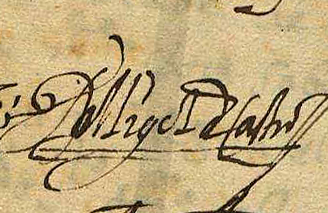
Dō Migel d̄ Castro
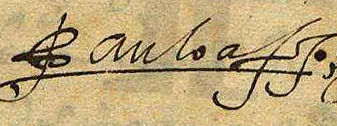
Paulo afōso
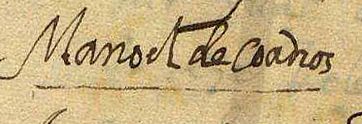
Manoel de Coadros
